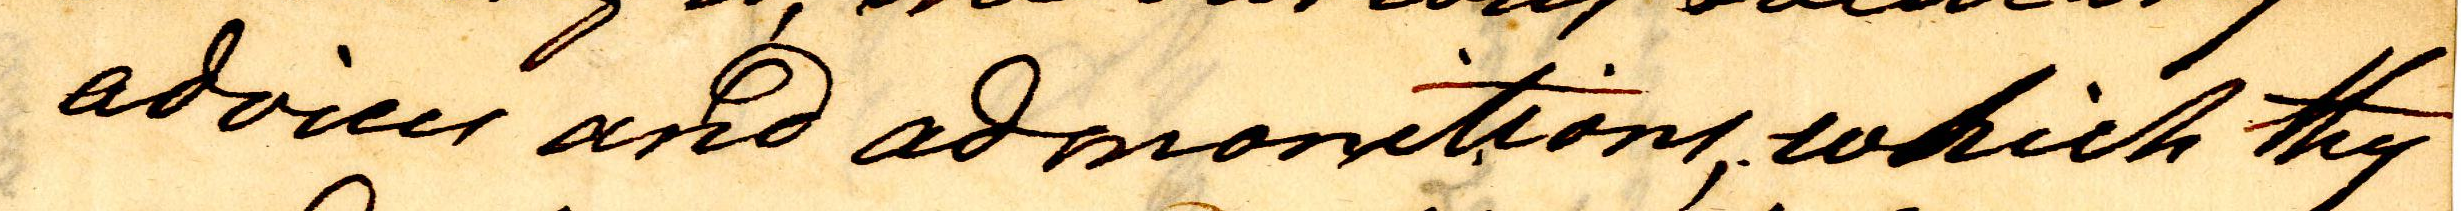advices and admonitions, which thy
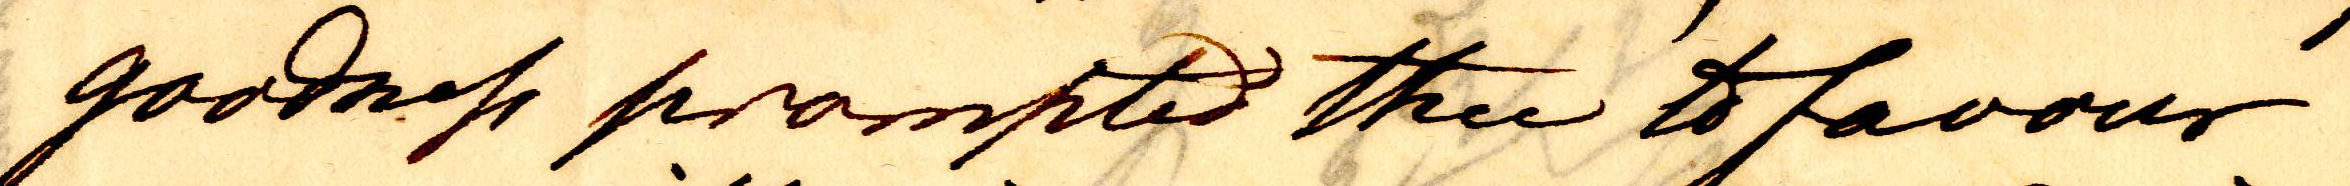goodness prompted thee to favour
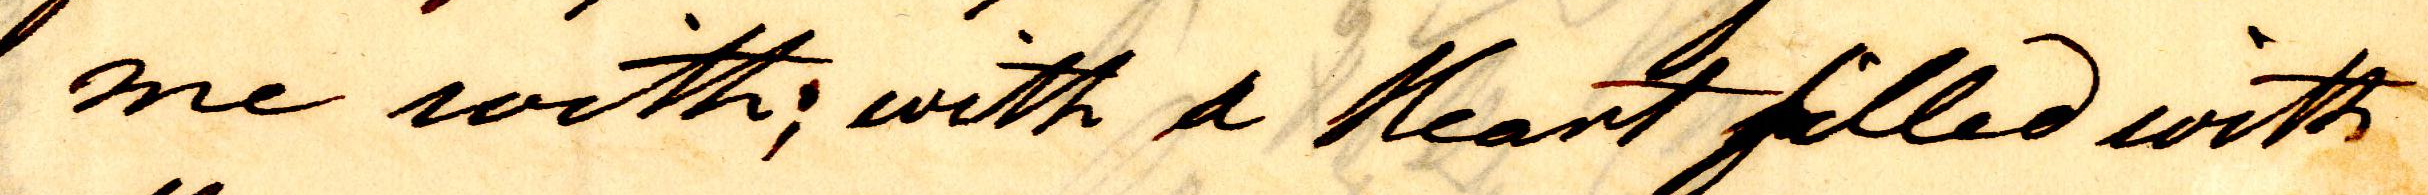me with; with a Heart filled with
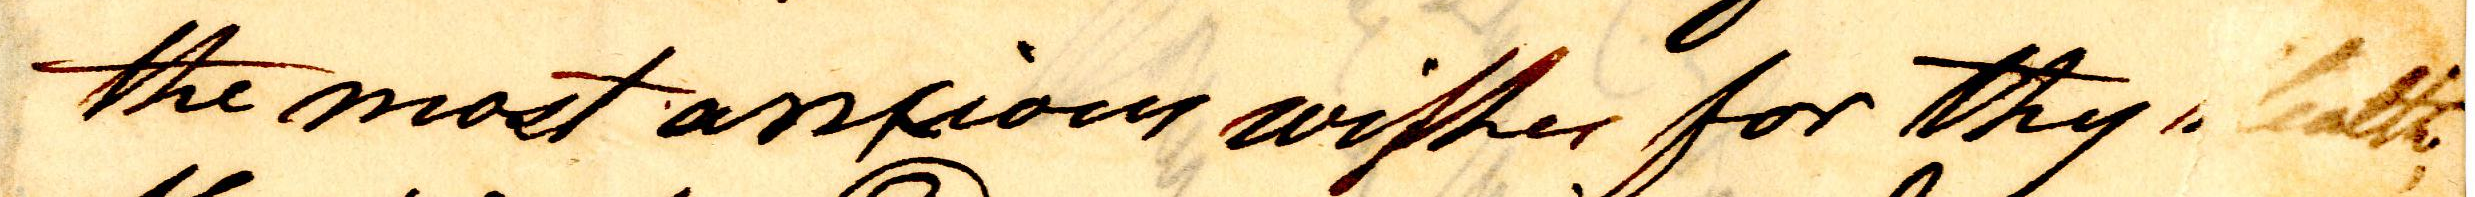the most anxious wishes for thy Health
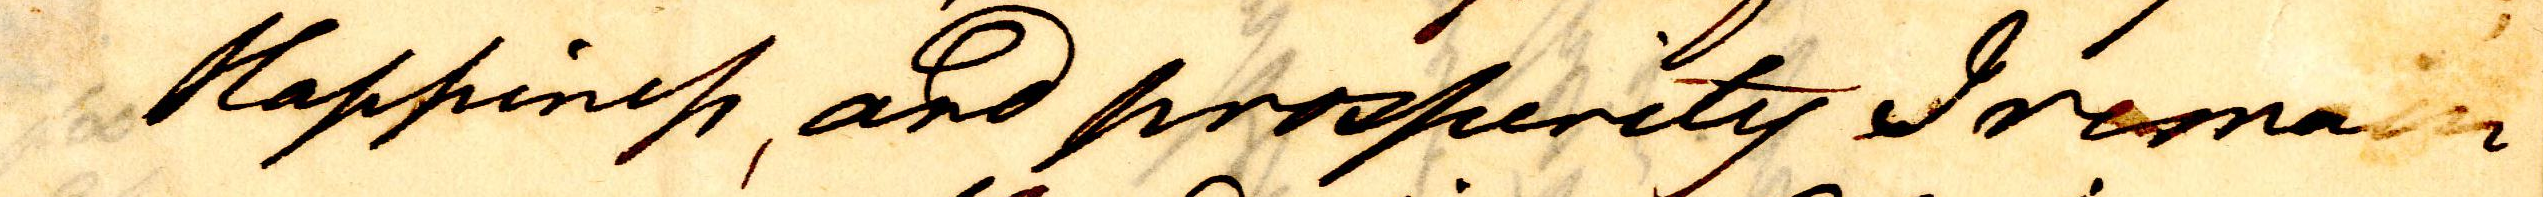Happiness, and prosperity I remain
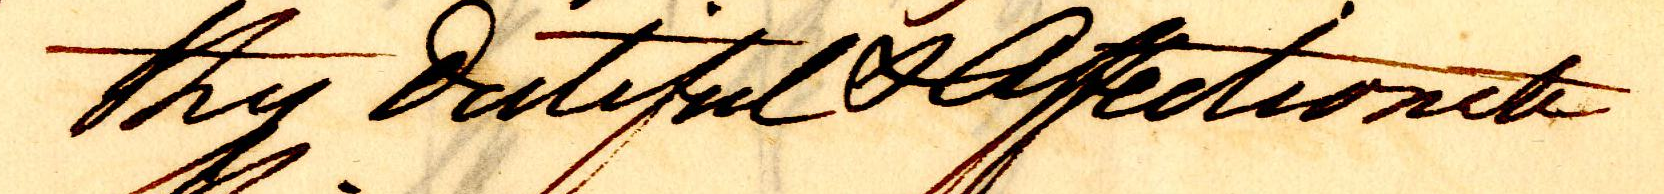thy dutiful & Affectionate
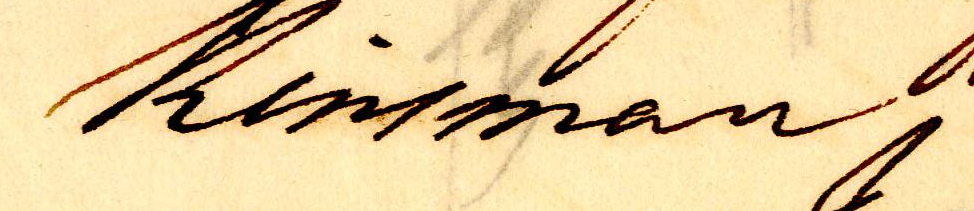Kinsman
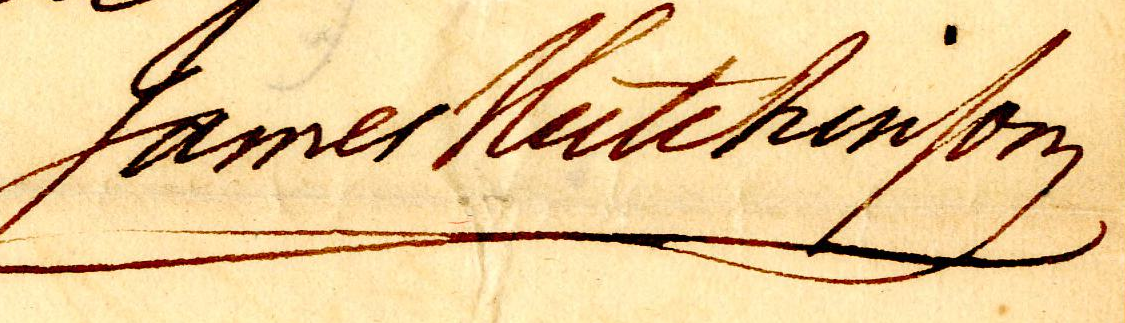James Hutchinson
